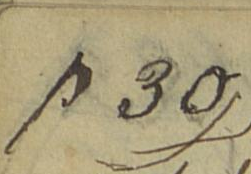p 30
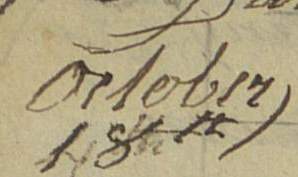October
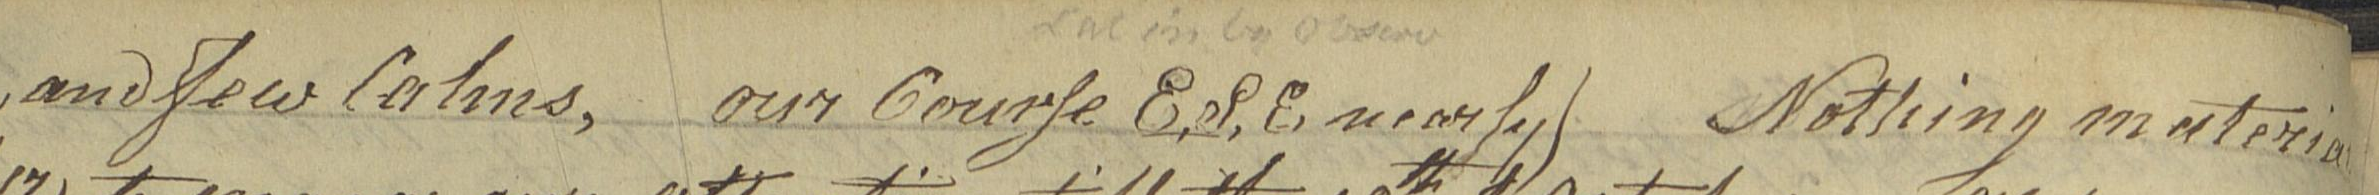and few Calms, our Course E.S.E. nearly) Nothing materia-
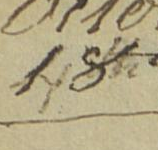18^th
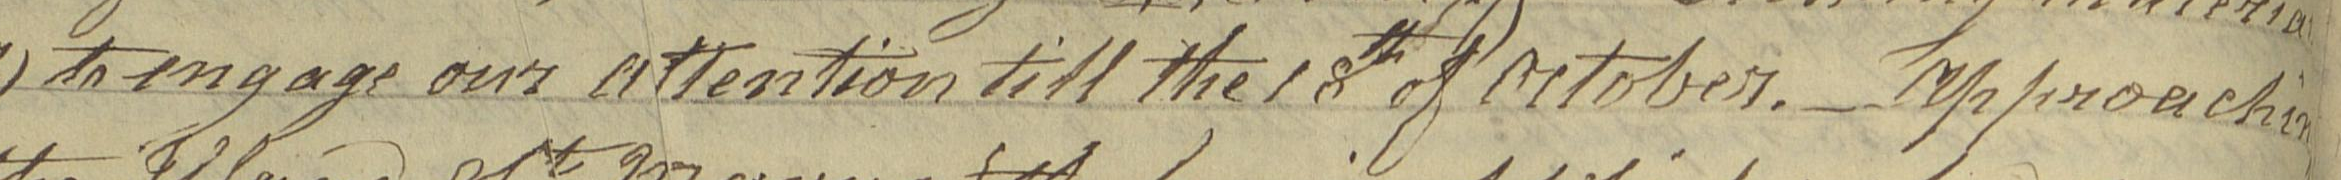to engage our attention till the 18^th of October. Approachin-
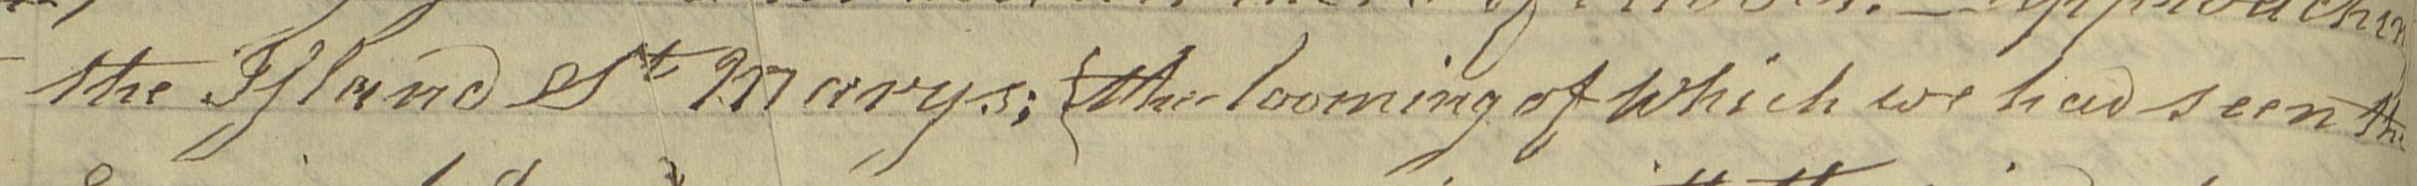the Island S^t Marys; (the looming of which we had seen t-
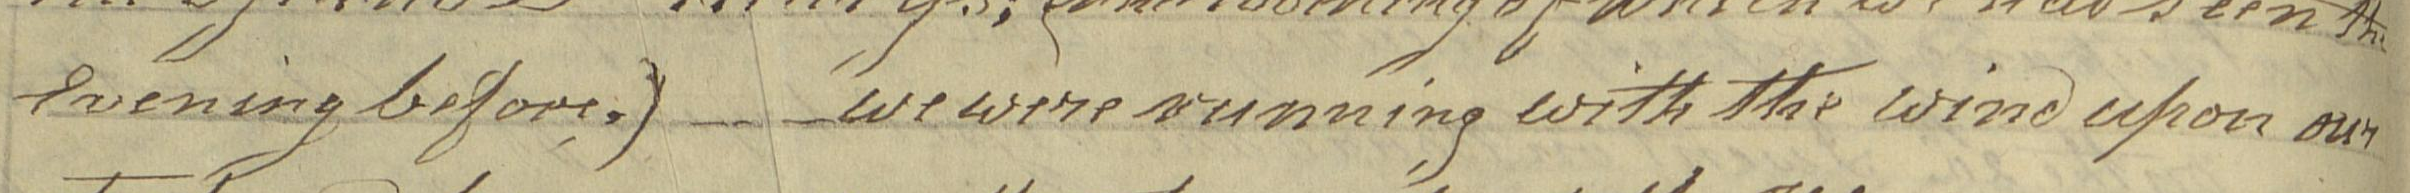evening before.) we were running with the wind upon our
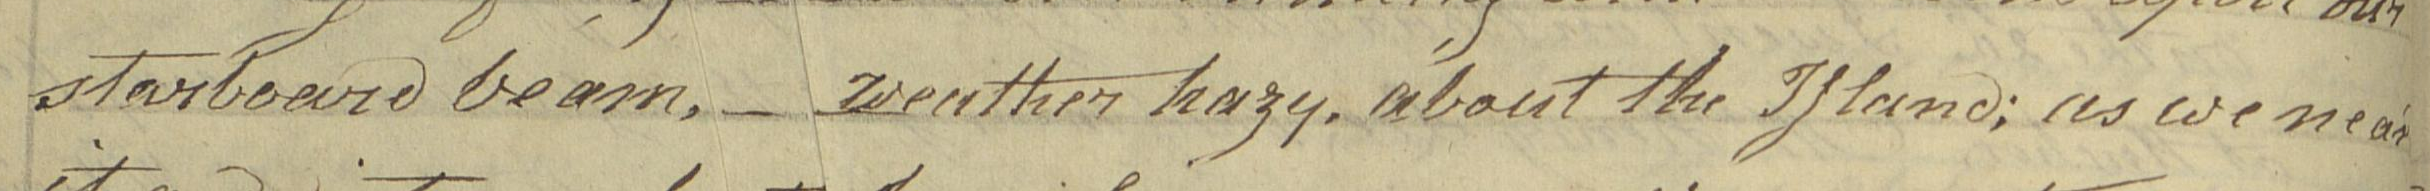starboard beam.- Weathor hazy, about the Island: as we near
